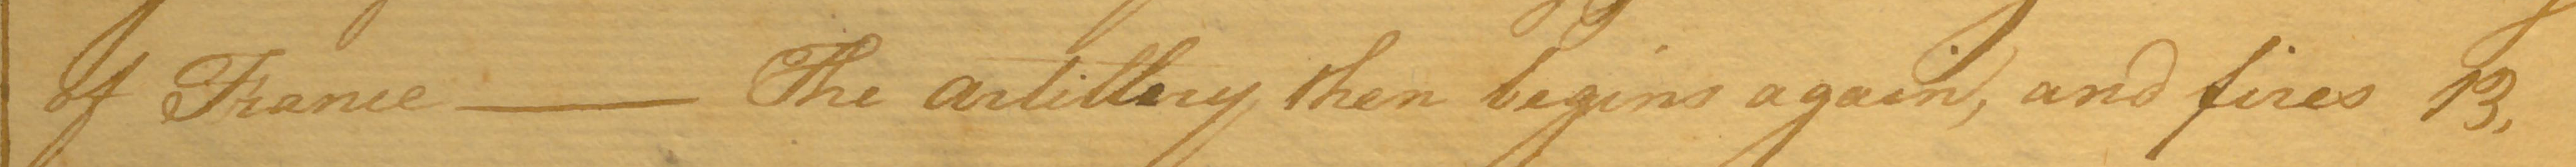of France- The artillery then begins again, and fires 13.
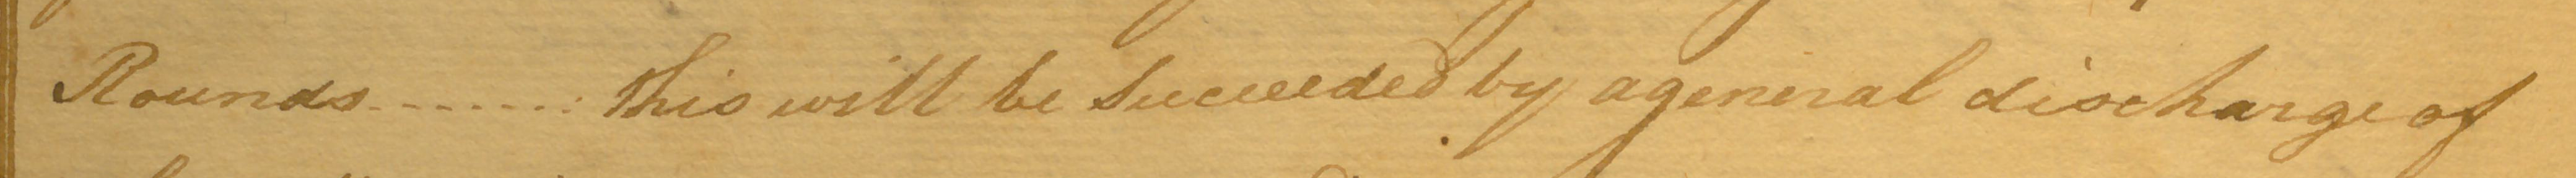Rounds. ...... This will be succeeded by a general discharge of
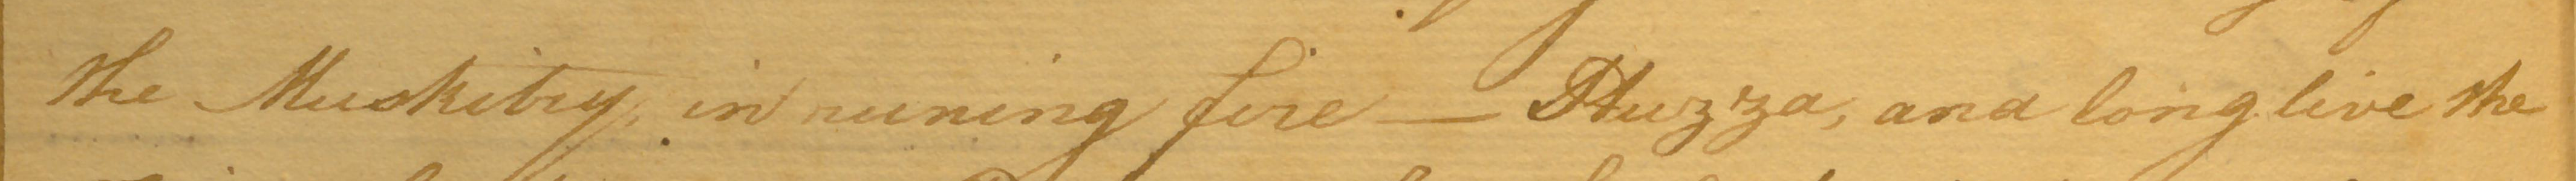the Muskitry in runing fire- Huzza, and long live the
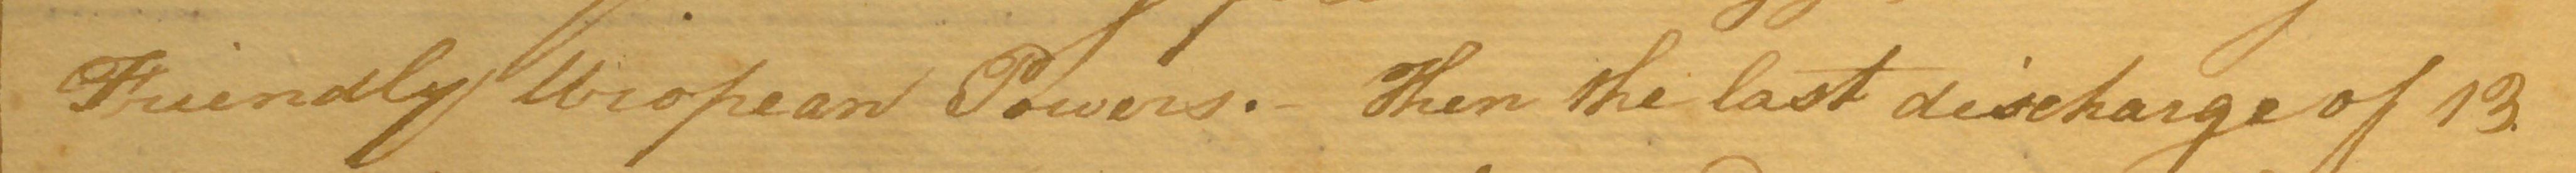Friendly Uropean Powers. Then the last discharge of 13
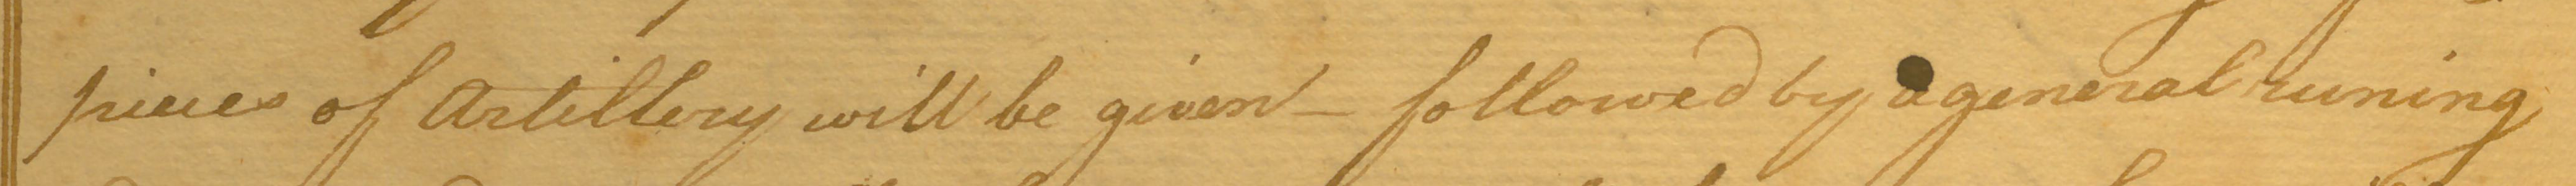pieces of Artillery will be given- followed by a general running
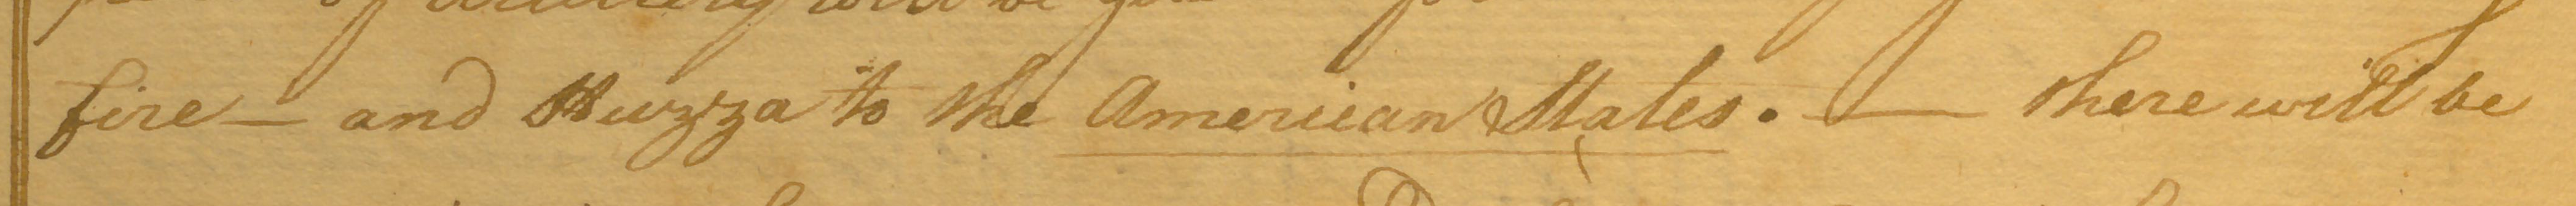fire- and Huzza to the American States.- there will be
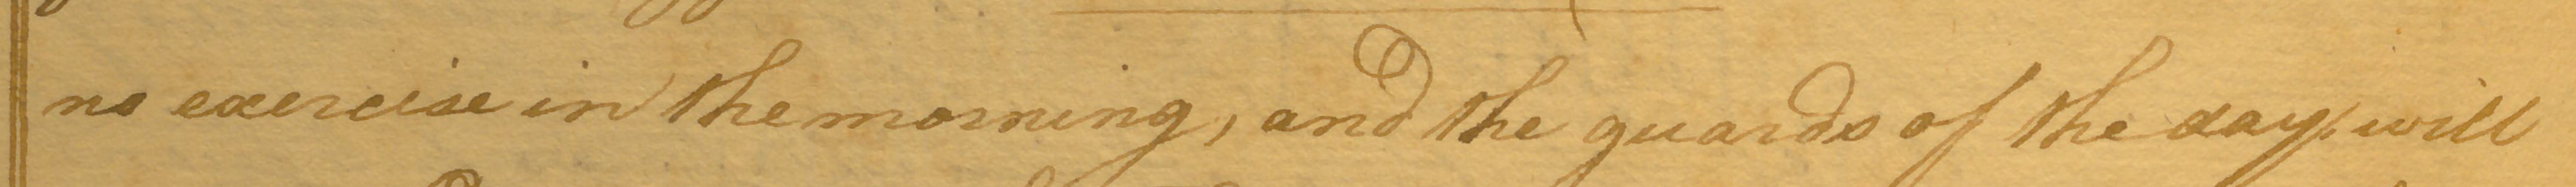no exercise in the morning, and the guards of the day will
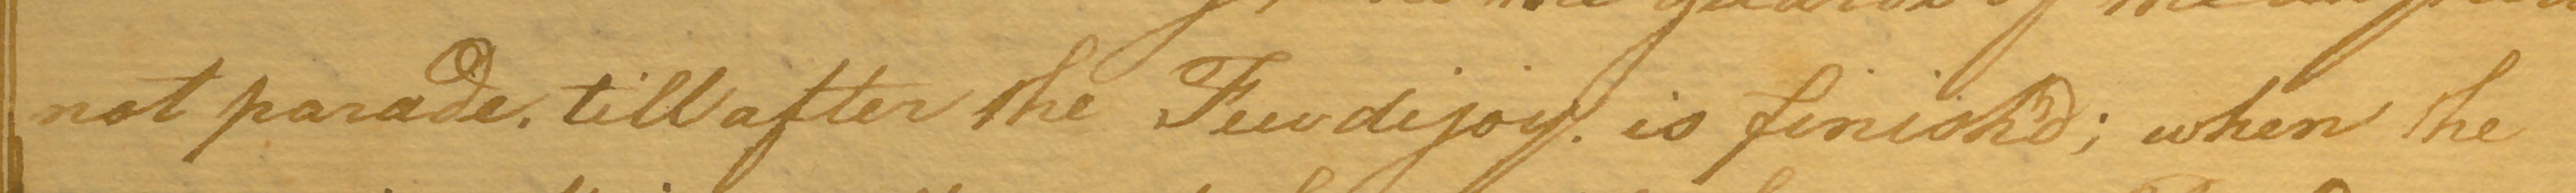not parade till after the Feu de joiy is finish'd; when the
